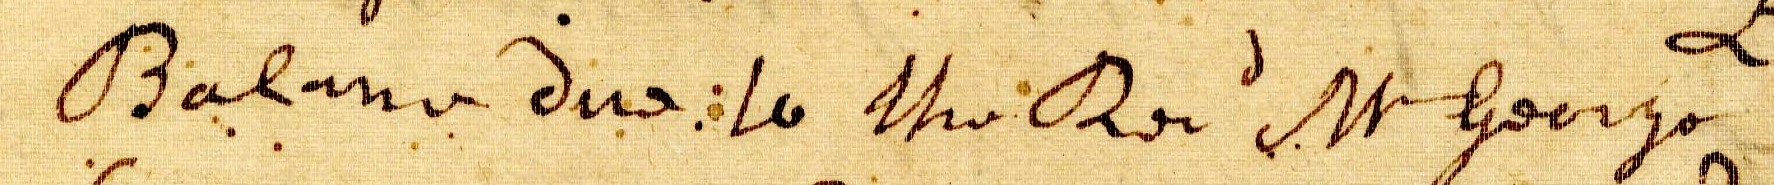Balance due: to the Rev^d Mr George
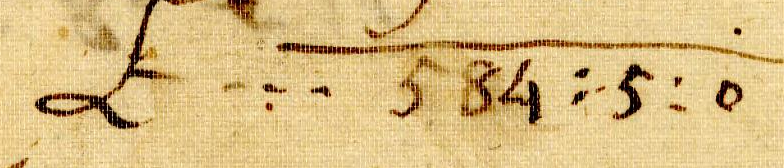£584:5:0
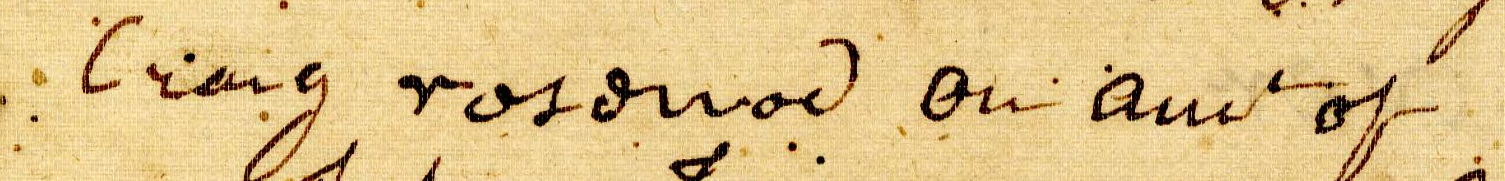Craig reserved On Acco^t of
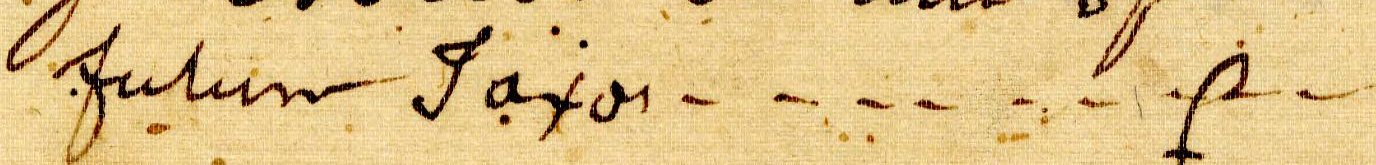future Taxes.........
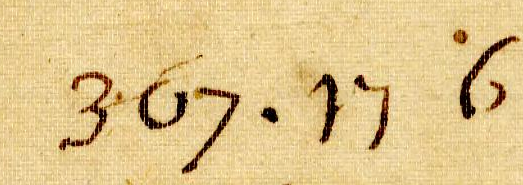307. 176
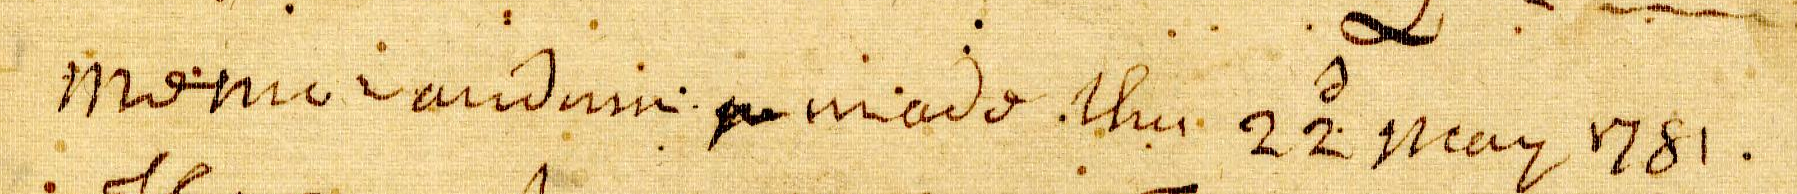Memorandum [__] made this 22^d May 1781.
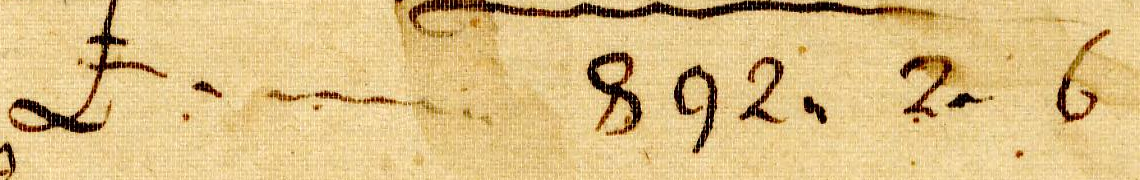£... 892.2.6
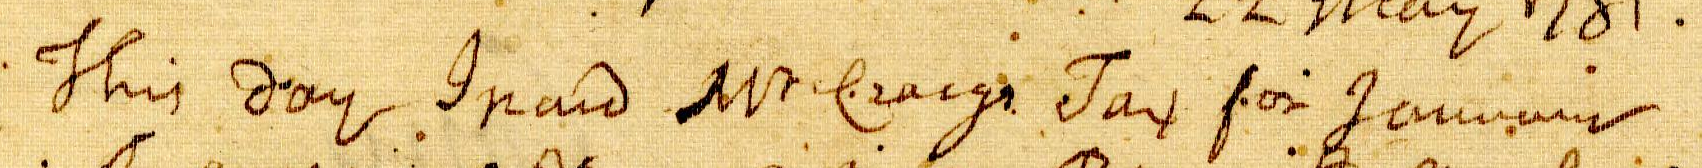This day I paid M^r Craigs Tax for January
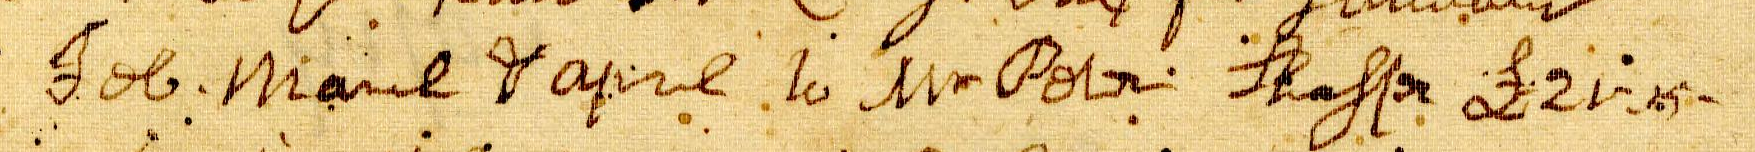Job. March & April to M^r Peter Shafner £21.15-
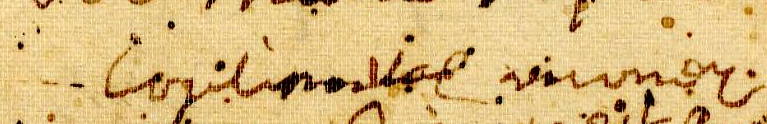Continental Money
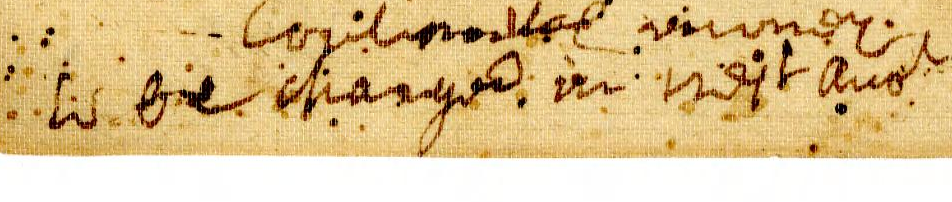to be changed in this Acco^t
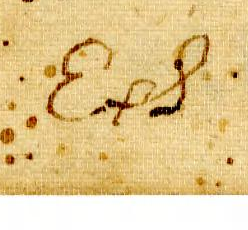E.S
